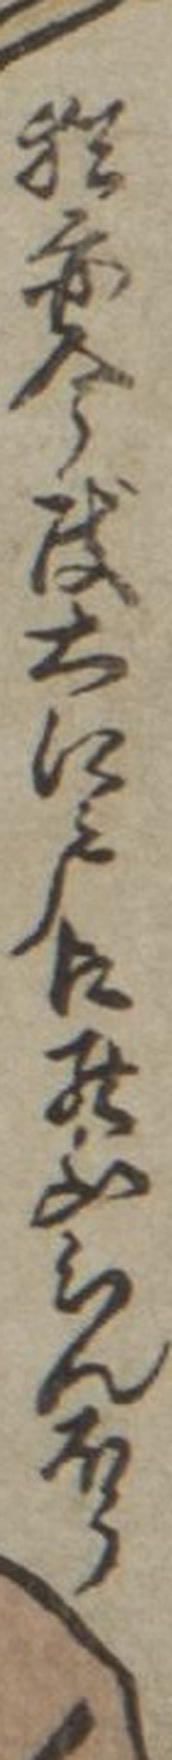猶亦今度大江戸江罷出らんほう
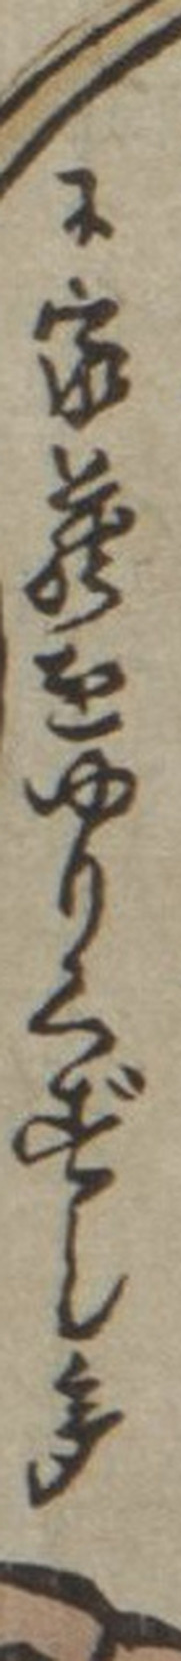に家蔵をゆりくずし多
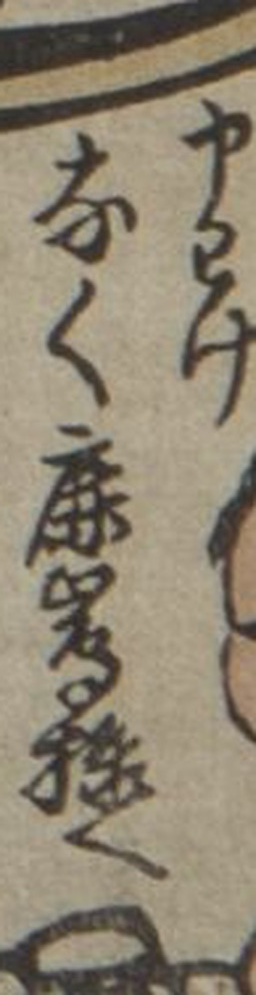なく鹿嶌様へ
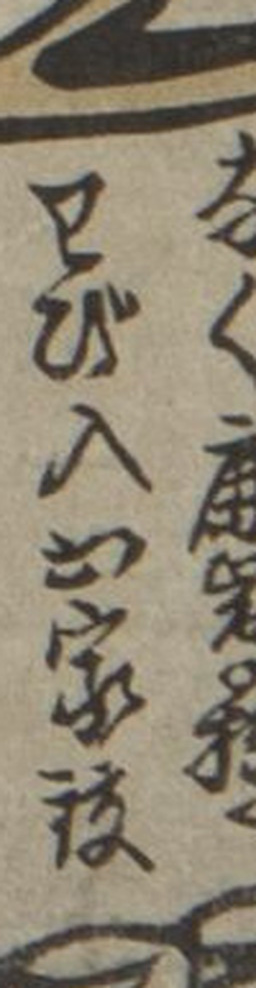わび入出家致
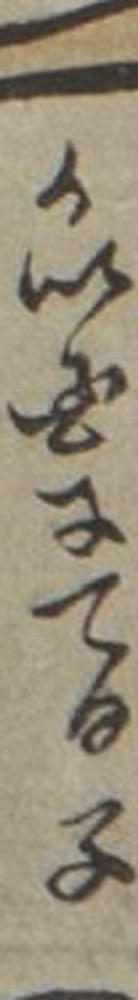かい国にてるね
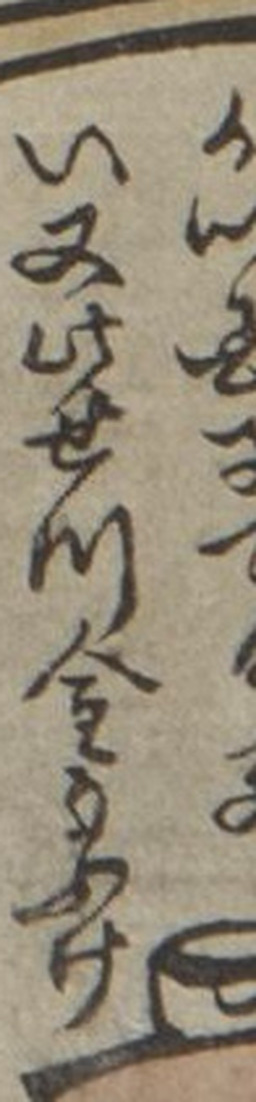い又此せつ金もふけ
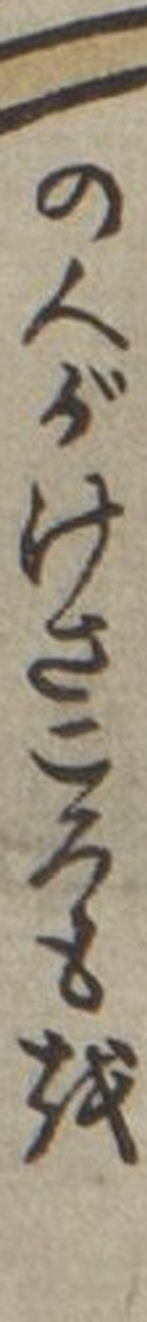の人がけさころもを
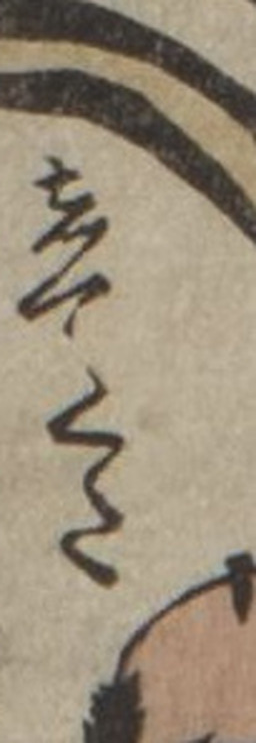してくた
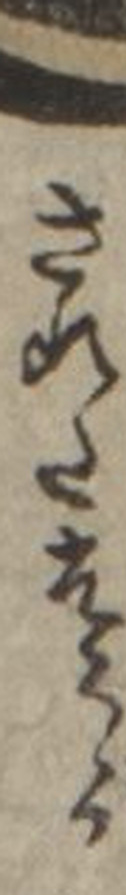されたはうが
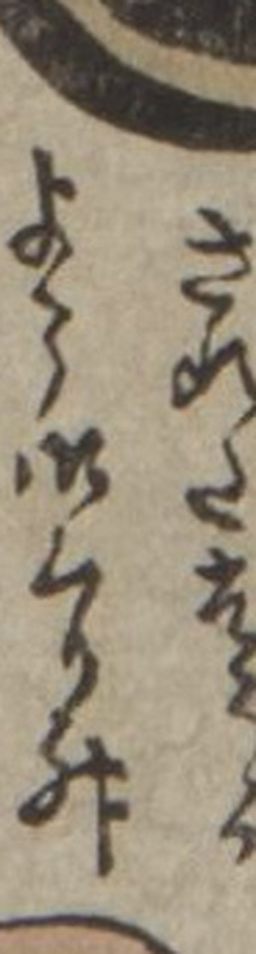よう御厶り升
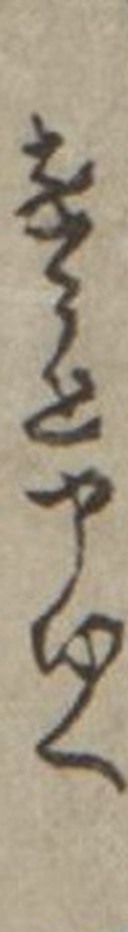しやうと申ゆへ
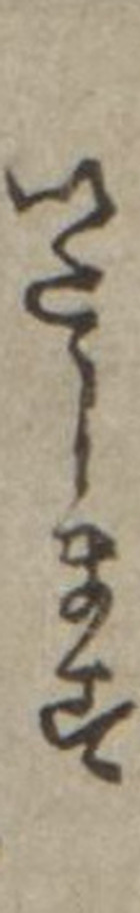いたします
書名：地震百万遍
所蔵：あいおいニッセイ同和損保株式会社
